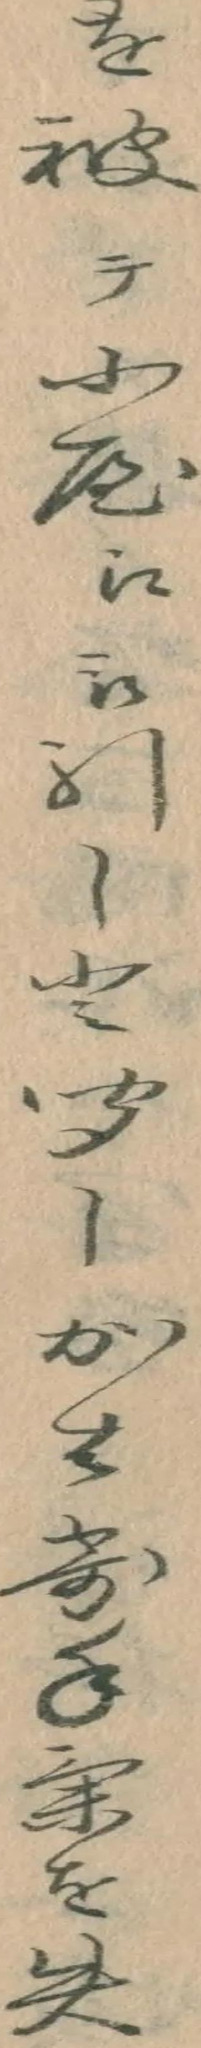を被て小屋江被引し登聞しか者寄手気を失
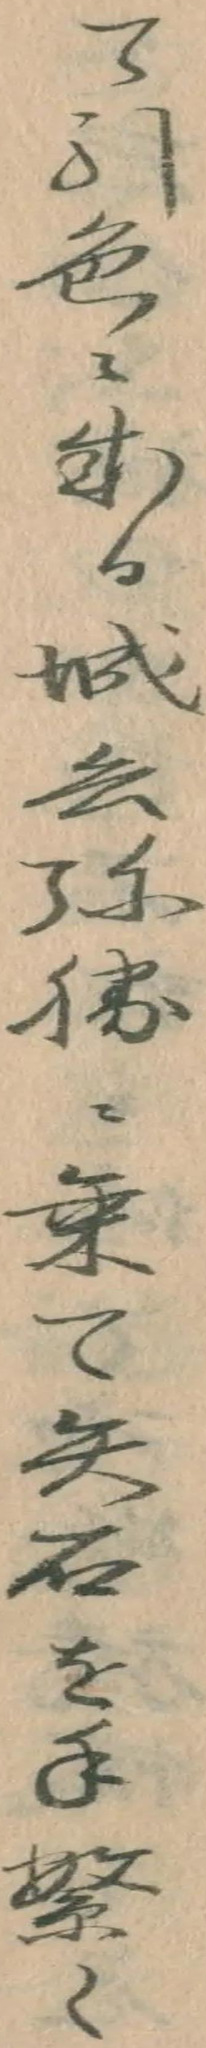て引色に成る城兵弥勝に乗て矢石を手繁く
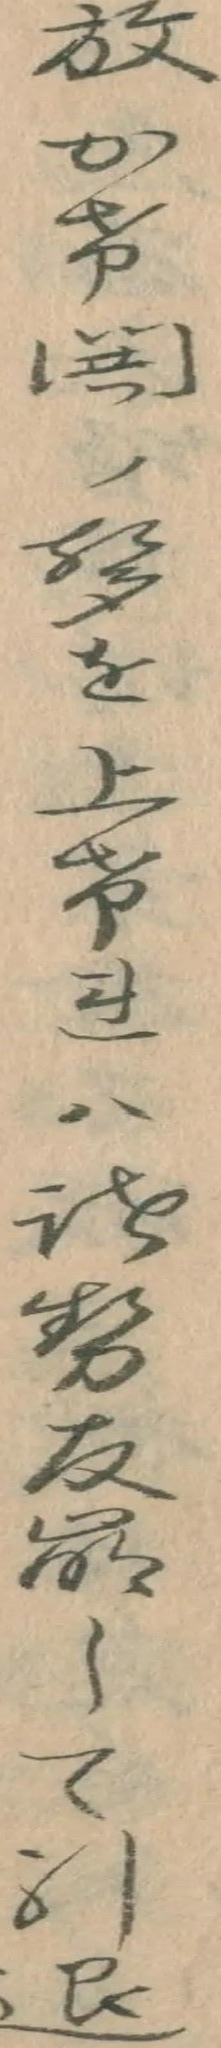放か希鬨之声を上希連は諸勢友崩して引退

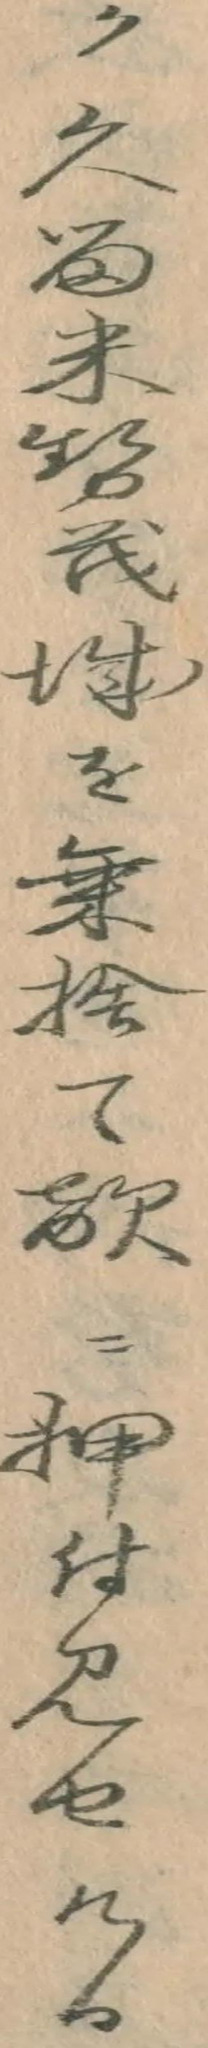く久留米勢茂城を乗捨て敵に押付見せける
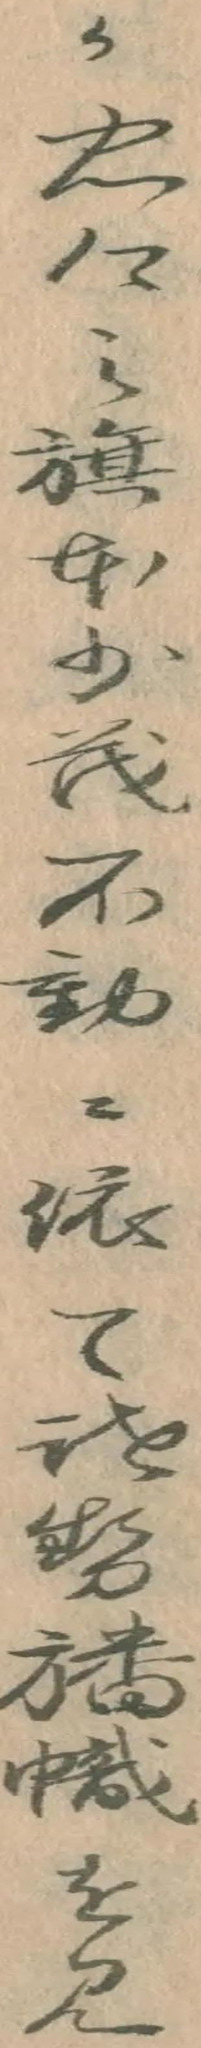か忠郷之旗本少茂不動に依て諸勢旛幟を見
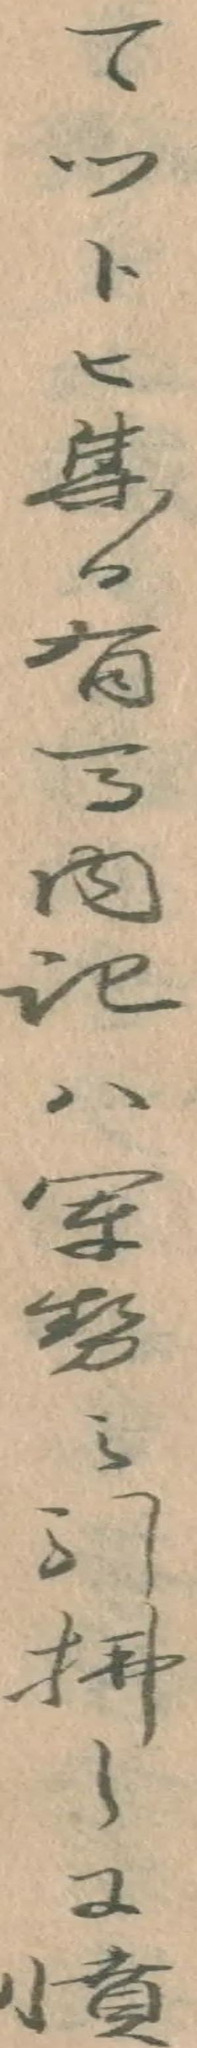てつとに集る有馬内記は軍勢之引払し尓憤
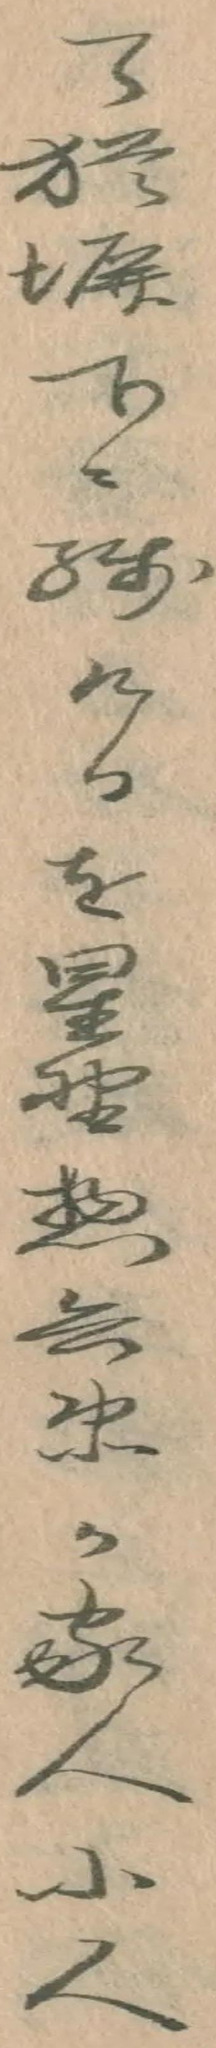て猶塀下に残けるを星野惣兵衛か家人小人
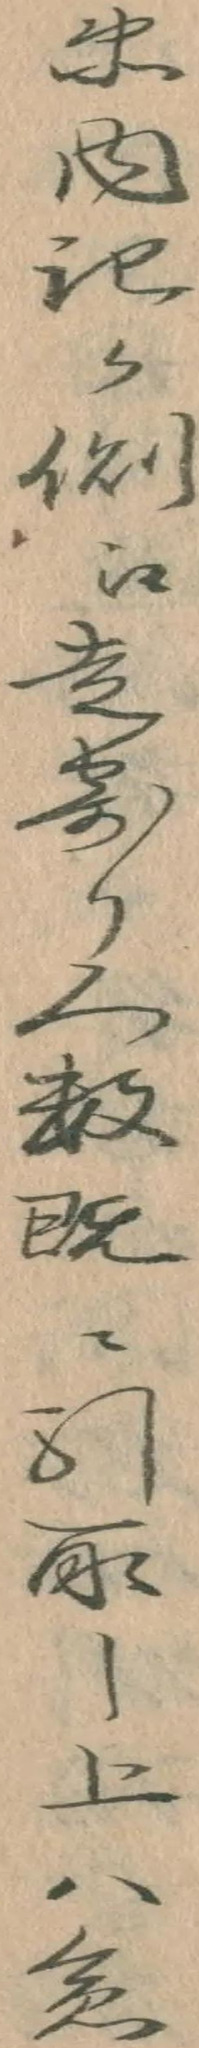衛内記か倒江走寄り人数既に引取し上は急
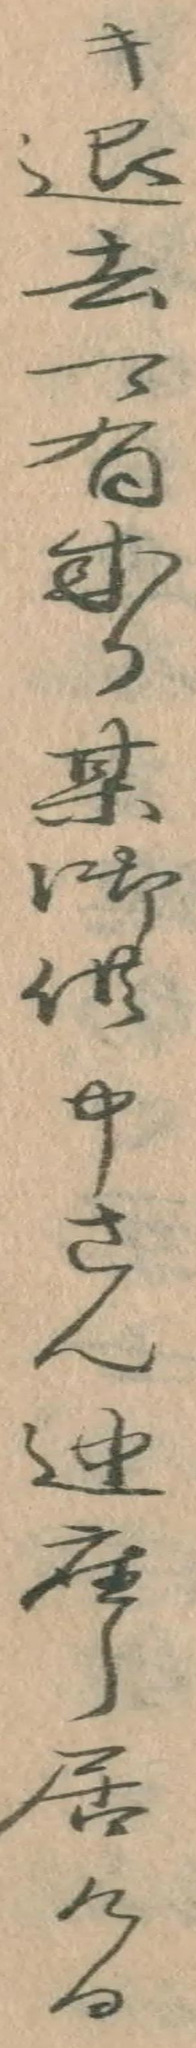き退去可有成り某御供申さん迚座し居ける
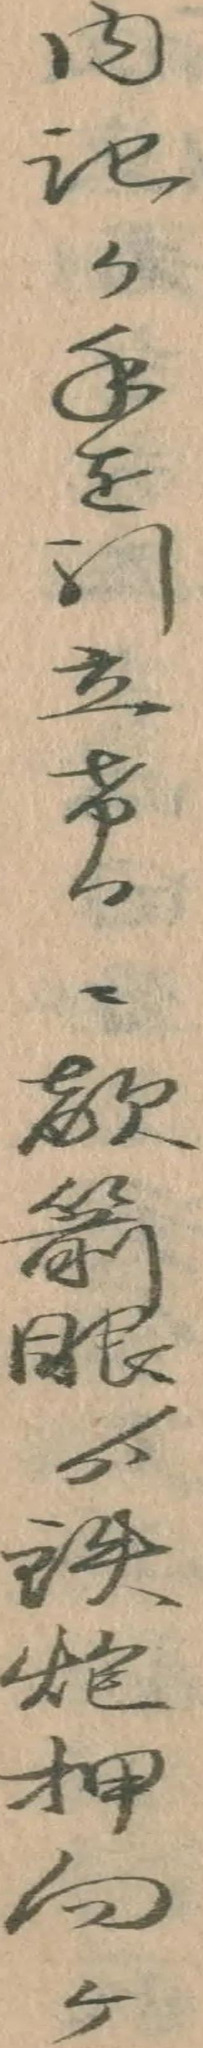内記か手を引立希るに敵箭眼ゟ鉄砲押向け
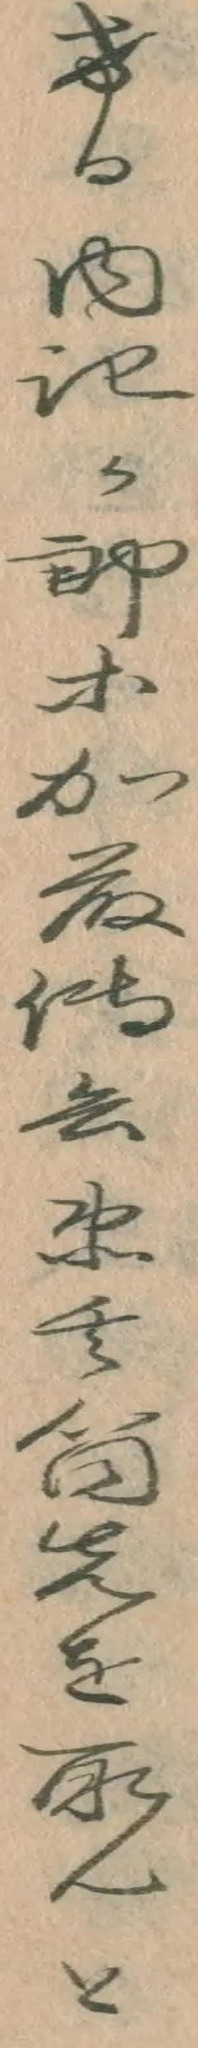希る内記か郎等加藤伝兵衛其筒先を取んと
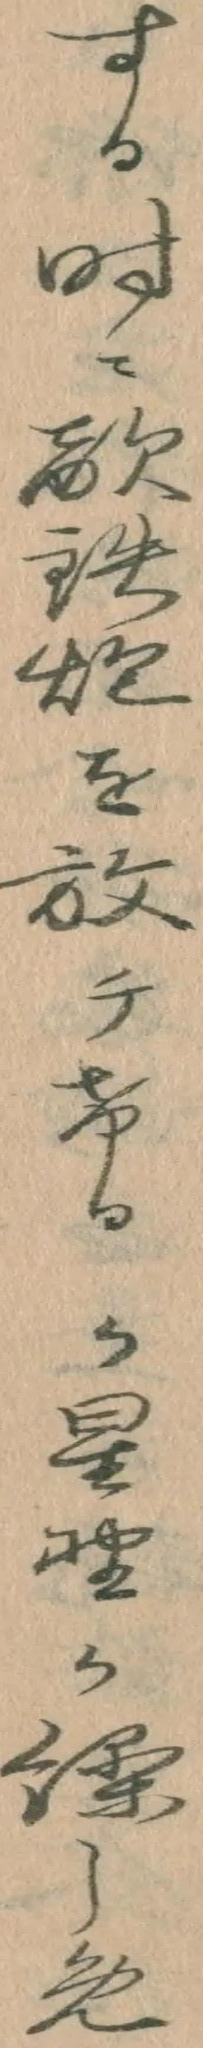する時に敵鉄砲を放て希るか星野か繰し免
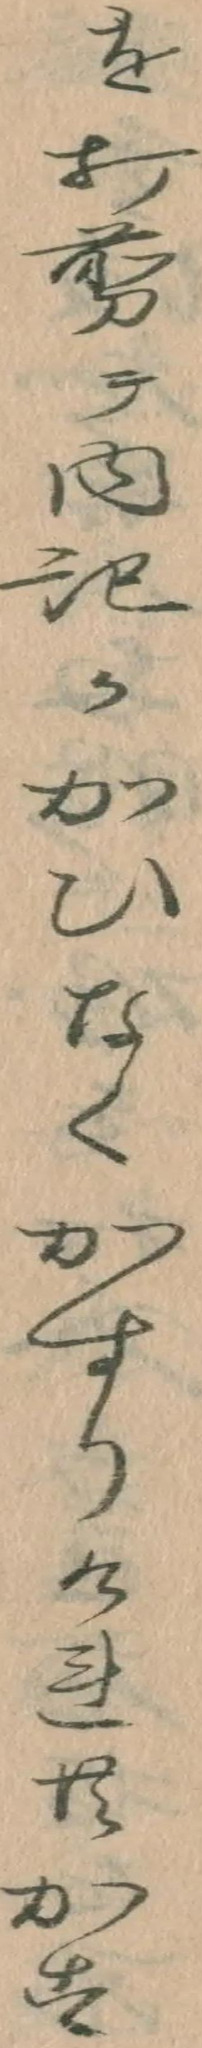を打箭て内記か加ひなく加すりけ連共加春
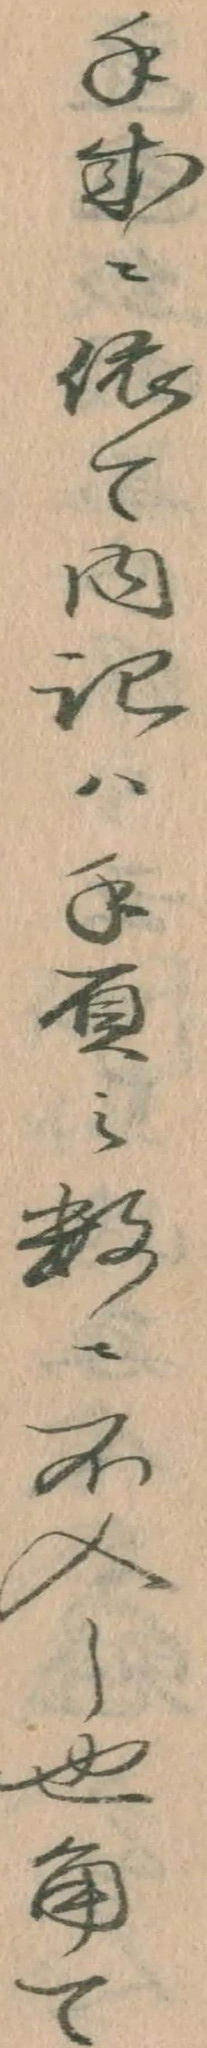手成に依て内記は手負之数に不入し也角て
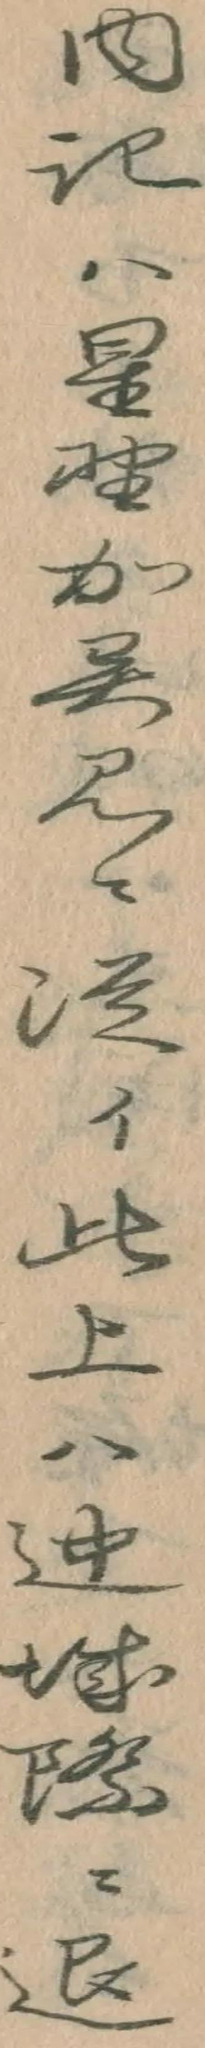内記は星野加異見に従い此上は迚城際に退
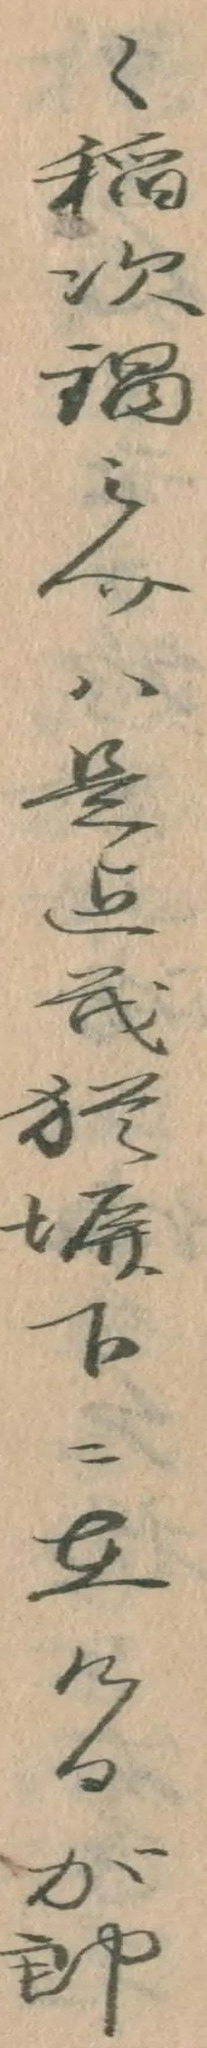く稲次鍋之介は是迄も猶塀下に在けるが郎
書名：切支丹御退治記 49巻. [5]
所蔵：国立国会図書館 National Diet Library, JAPAN
